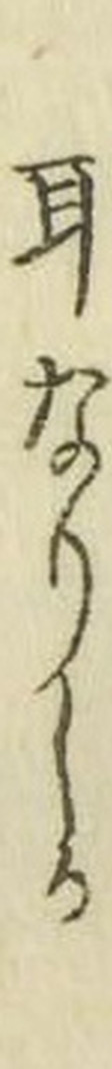耳なりしか
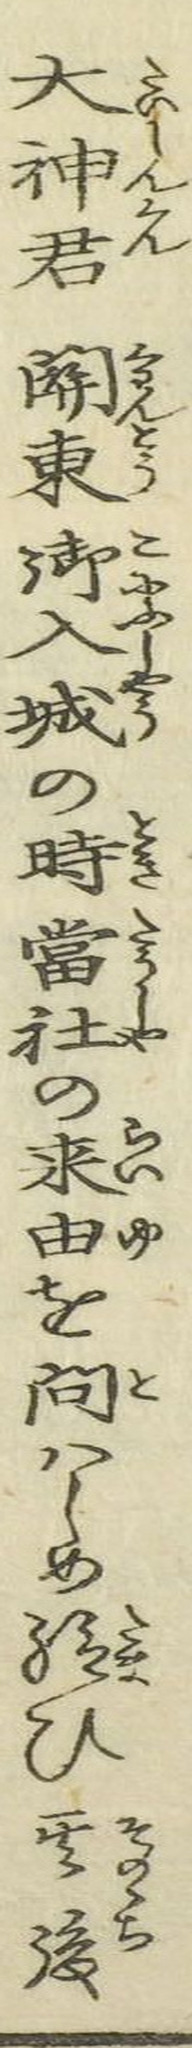大神君関東御入城の時当社の来由を問はしめ給ひ其後
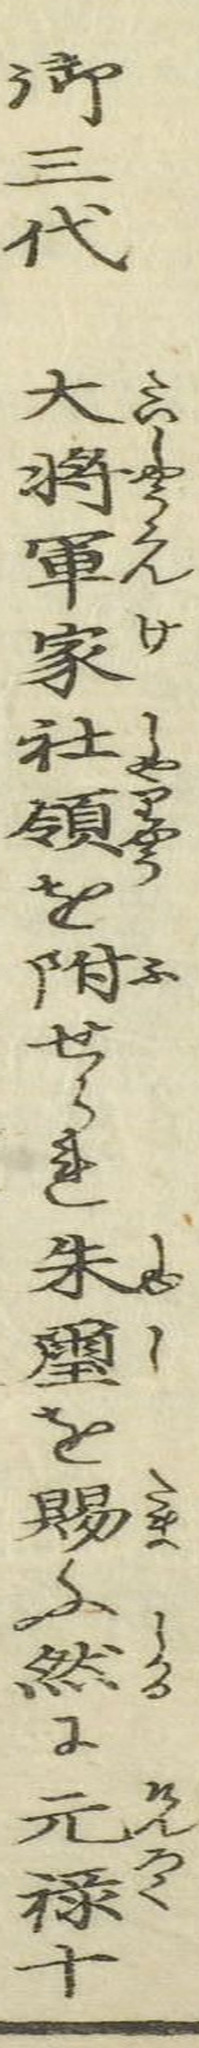御三代大将軍家社領を附せられ朱璽を賜ふ然に元禄十
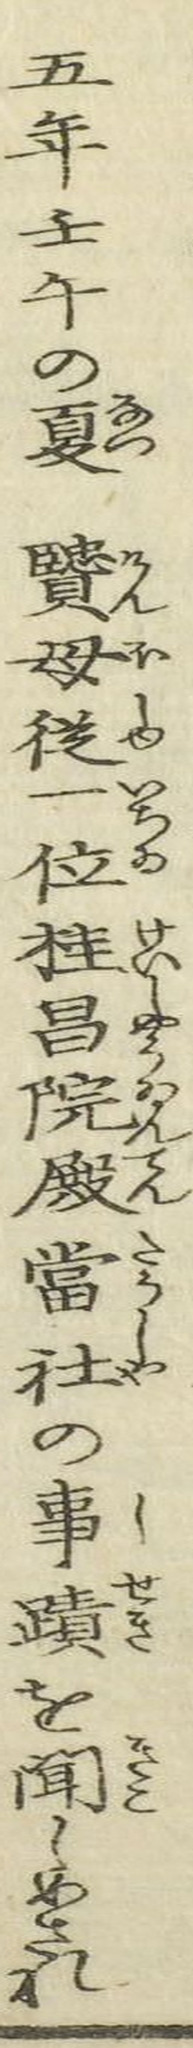五年壬午の夏賢母従一位桂昌院殿当社の事蹟を聞しめされ
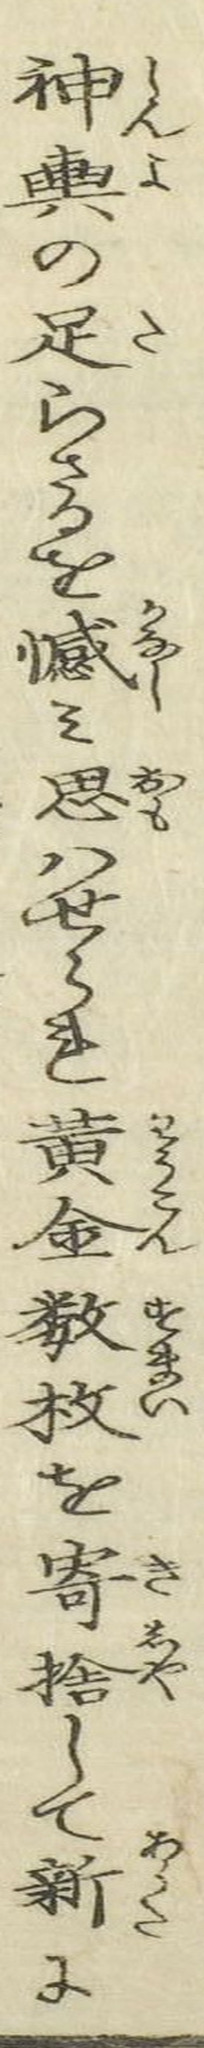神輿の足らさるを憾み思はせられ黄金数枚を寄捨して新に
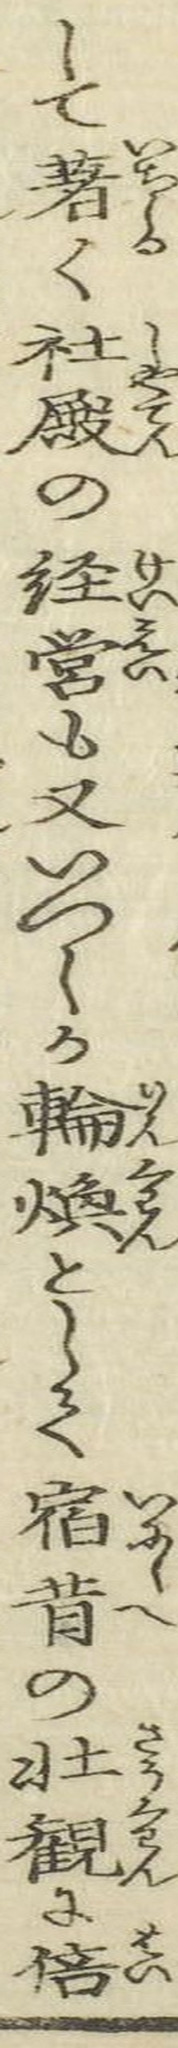して著く社殿の経営も又いつしか輪煥として宿昔の壮観に倍
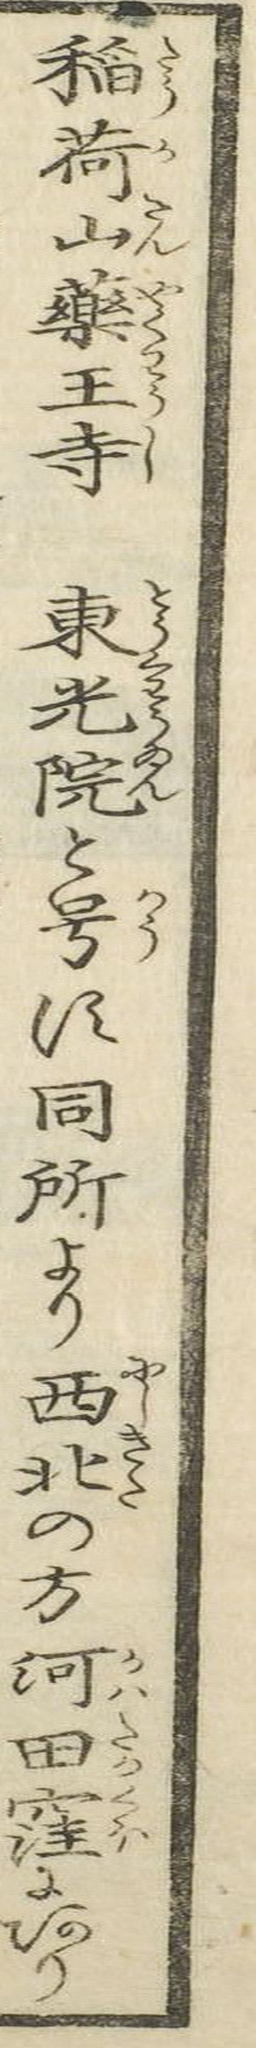稲荷山薬王寺東光院と号す同所より西北の方河田窪にあり
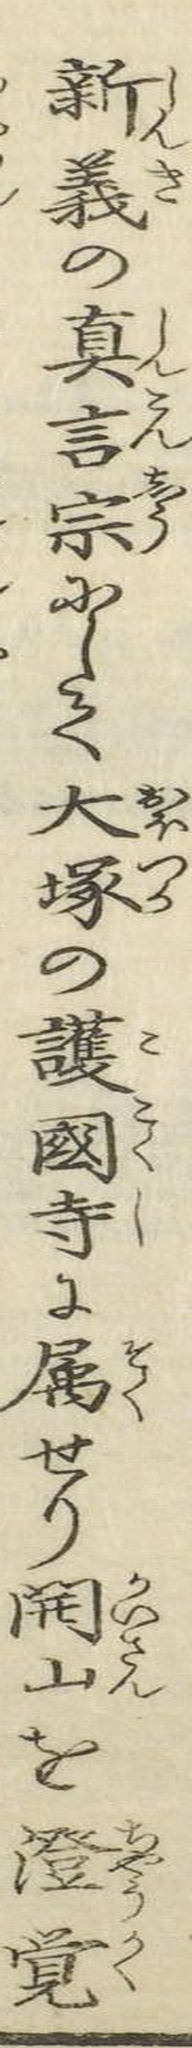新義の真言宗にして大塚の護国寺に属せり開山を澄覚
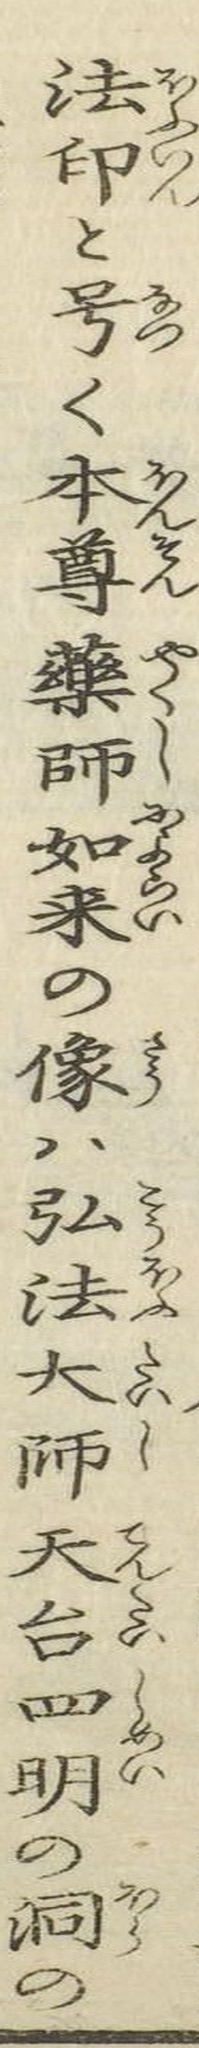法印と号く本尊薬師如来の像は弘法大師天台四明の洞の
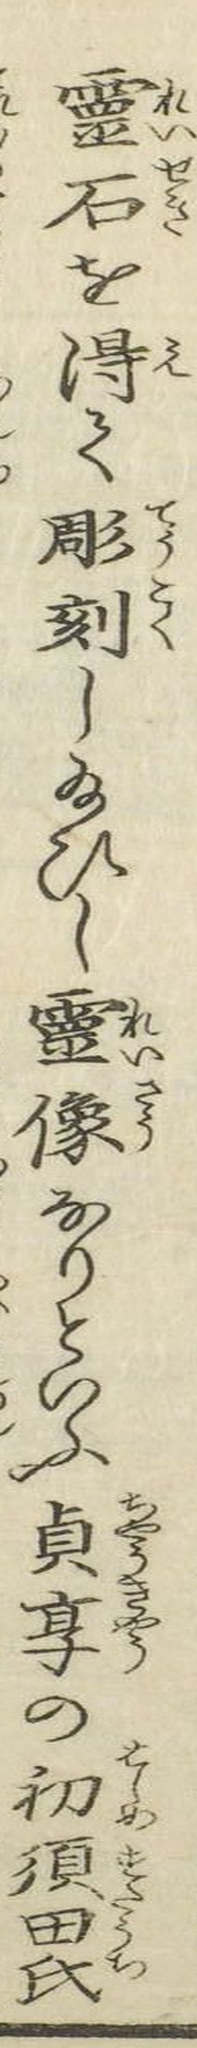霊石を得て彫刻し給ひし霊像なりといふ貞享の初須田氏
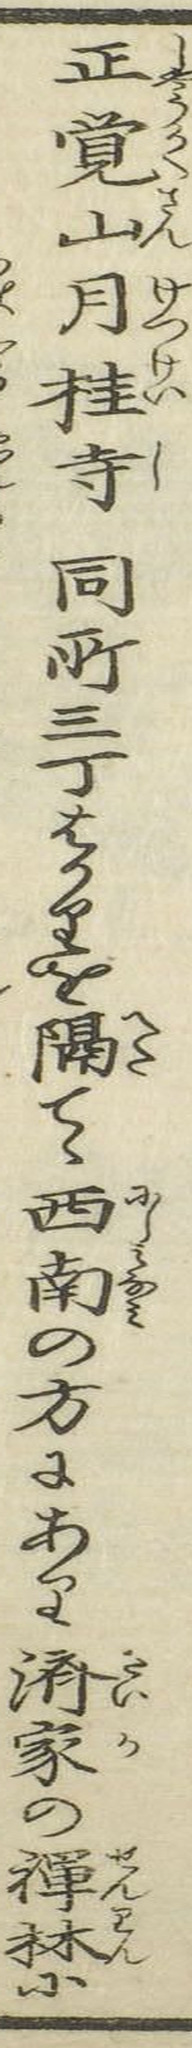正覚山月桂寺同所三丁はかりを隔てゝ西南の方にあり済家の禅林に
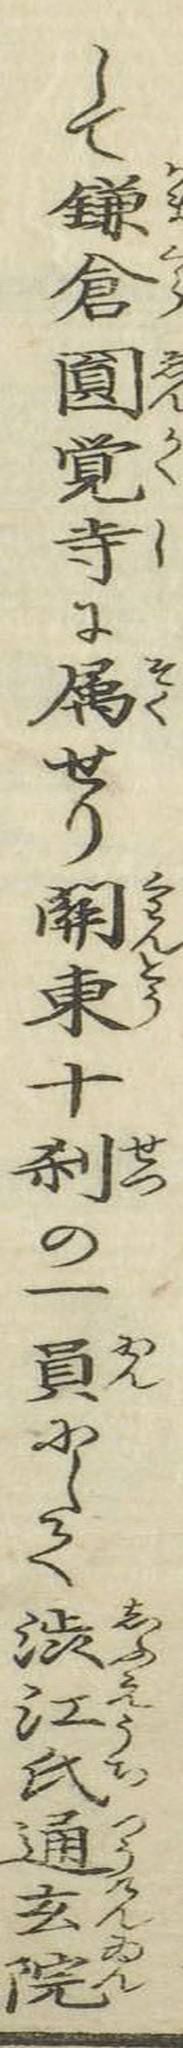して鎌倉円覚寺に属せり関東十刹の一員にして渋江氏通玄院
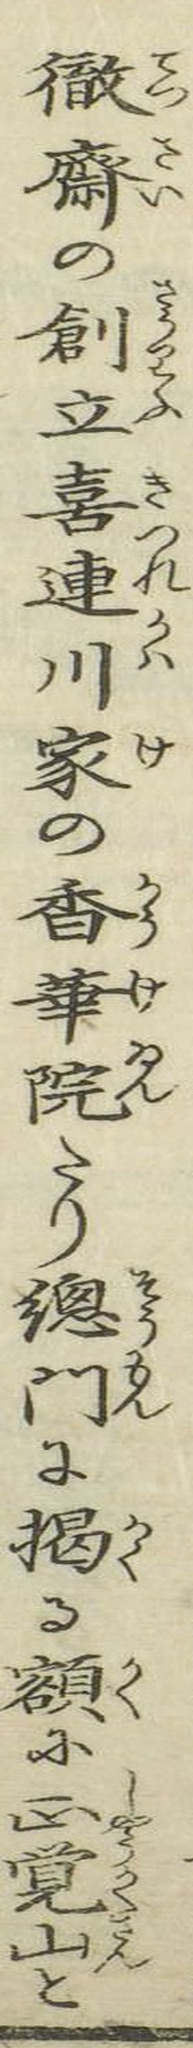徹斎の創立喜連川家の香華院たり総門に掲る額に正覚山と
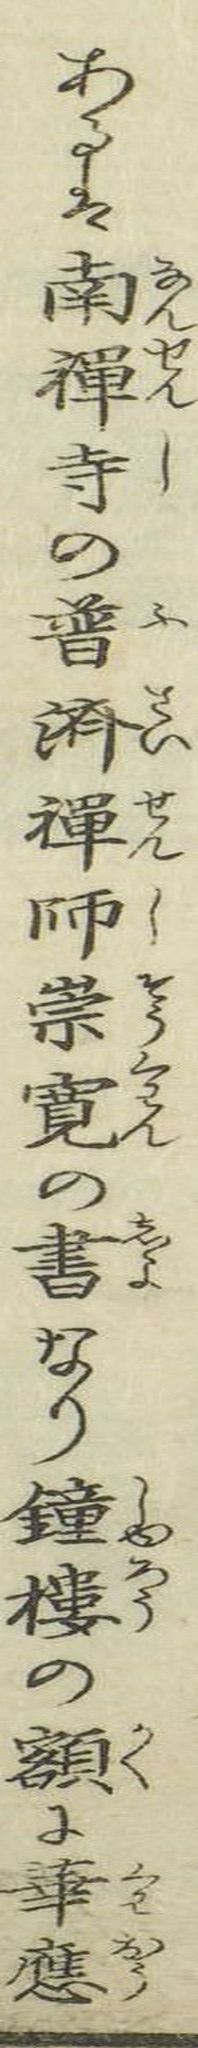あるは南禅寺の普済禅師崇寛の書なり鐘楼の額に華応
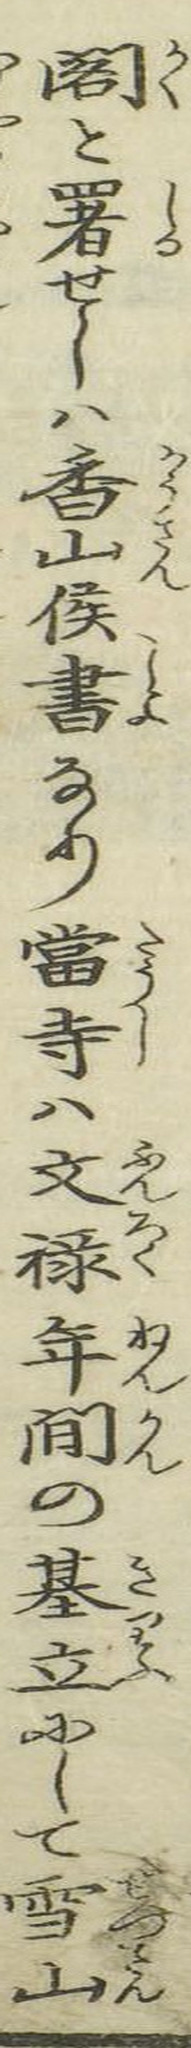閣と署せしは香山侯書なり当寺は文禄年間の基立にして雪山
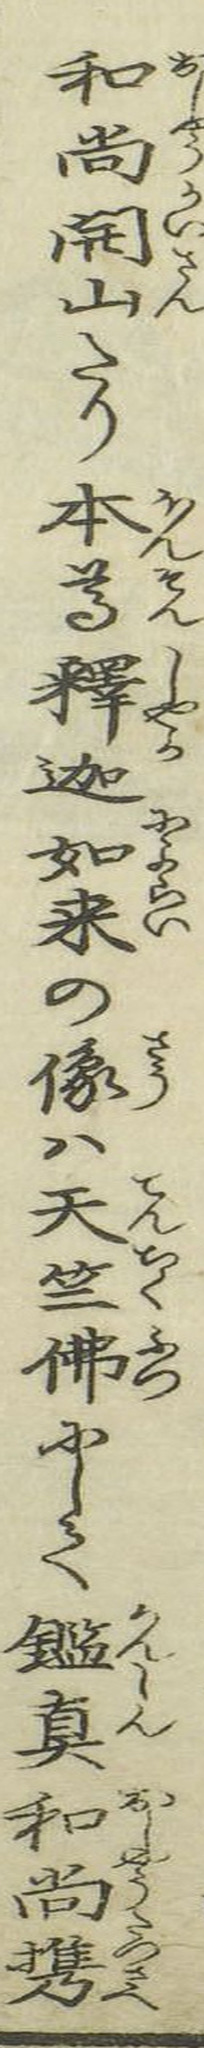和尚開山たり本尊釈迦如来の像は天竺仏にして鑑真和尚携
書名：江戸名所図会 20巻 巻之11
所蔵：東京学芸大学教育コンテンツアーカイブ
